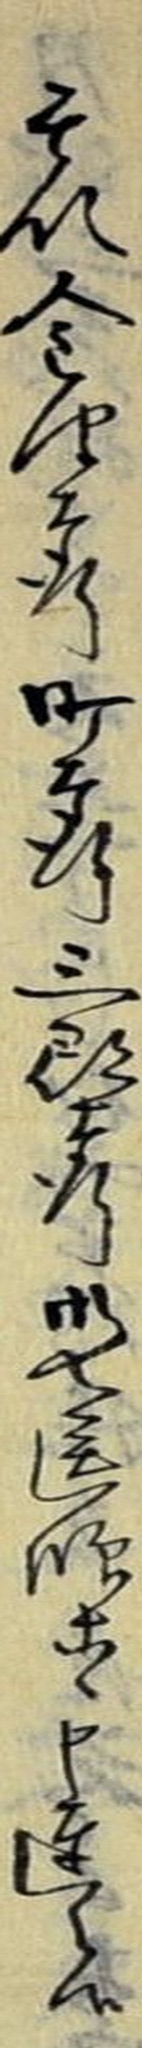其段金津奉行町奉行三郡奉行御匙医師等へ申達之候
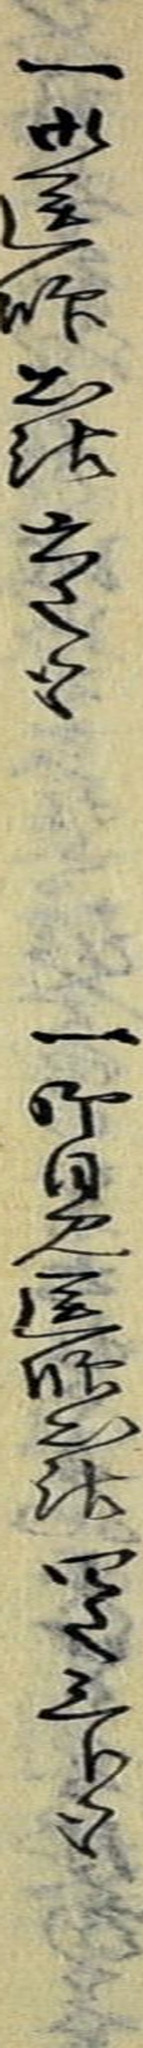一御医師出銀六匁つヽ一御目見医師出銀四匁三分つヽ
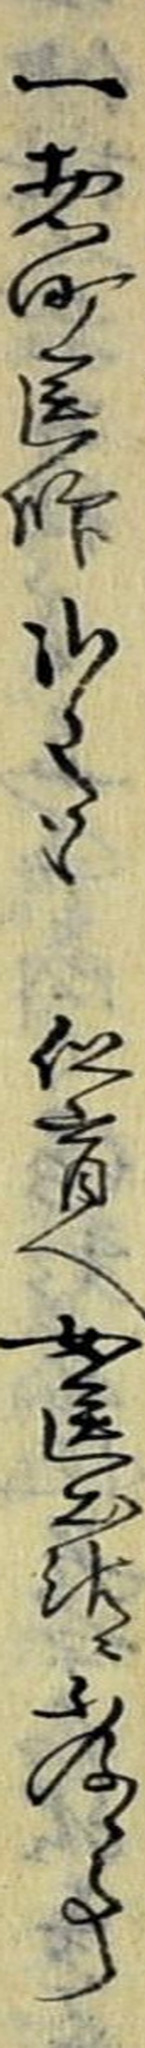一惣町医師弐匁つヽ但盲人女医出銀に不及候事
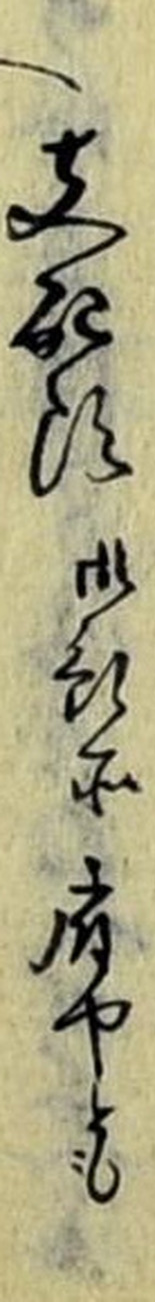支配頭御預所府中とも
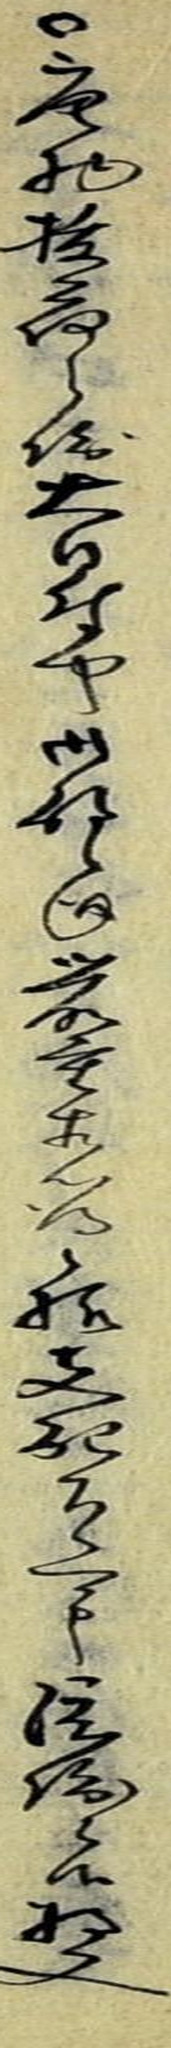○唐物抜荷之儀大目付中御触候趣厳重相心得候様支配下々可申渡儀に候猶又
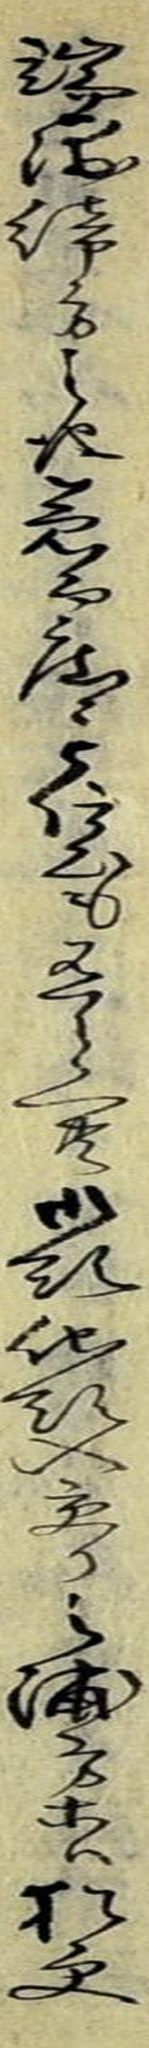端浦締り方之儀兼而度々被仰出も有之候へ共御領他領入交り之浦方等は猶更
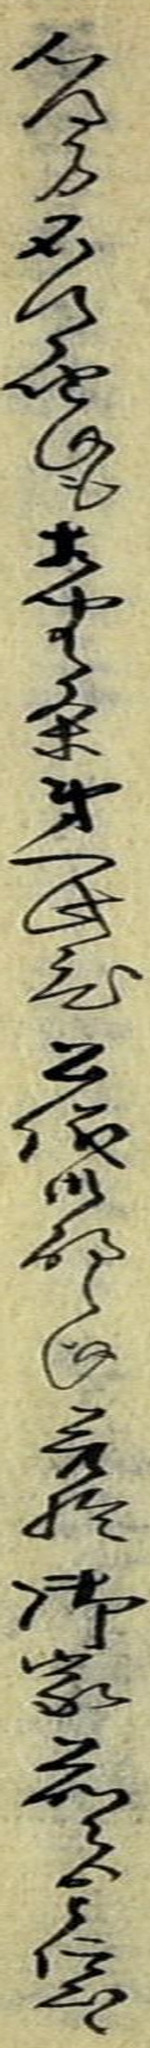心得方不行届趣も相聞候条第一此度公儀御触之趣并於御家前々ゟ被仰出候
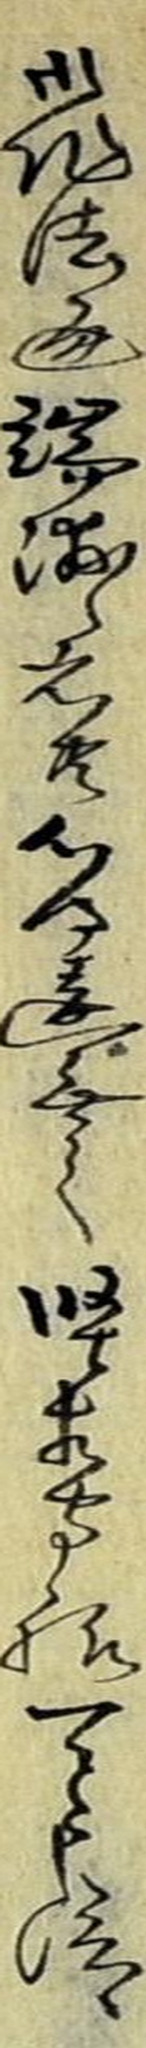御作法通端浦之者共心得違無之堅相守候様可被申渡候
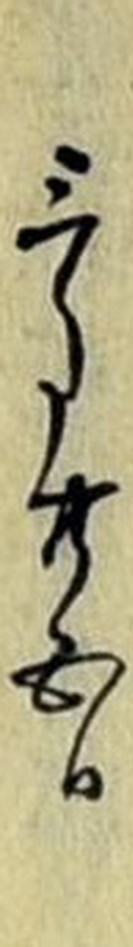三月廿五日
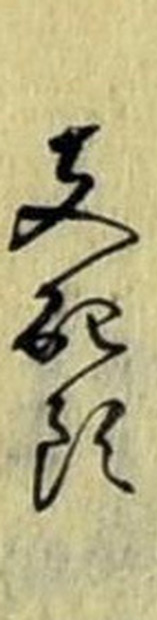支配頭
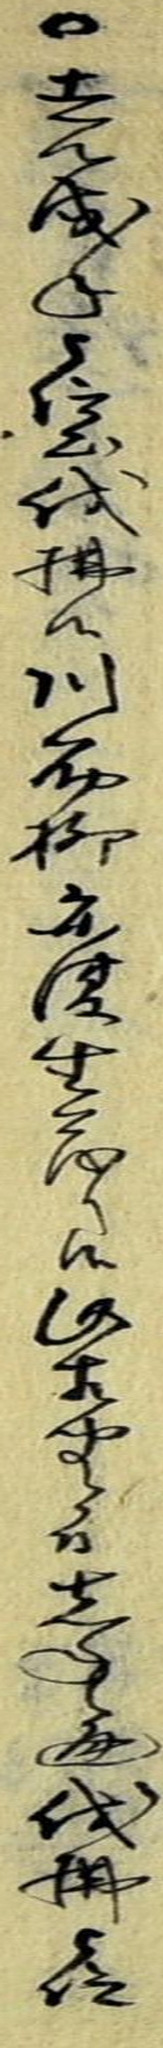○去戌年被仰出伐払候川筋柳亦復生帰り候趣相聞候に付先年通伐払被仰

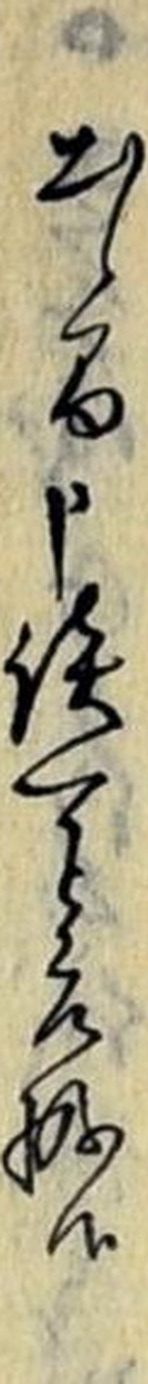出候間申談可被取扱候
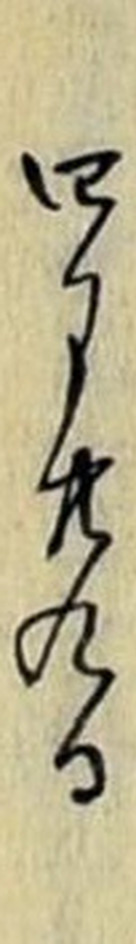四月廿九日
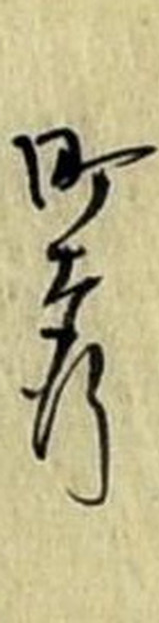御奉行
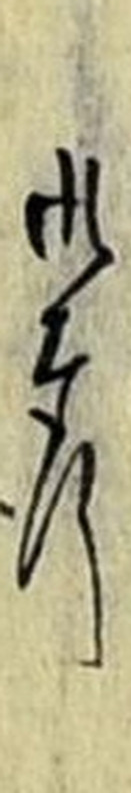御奉行
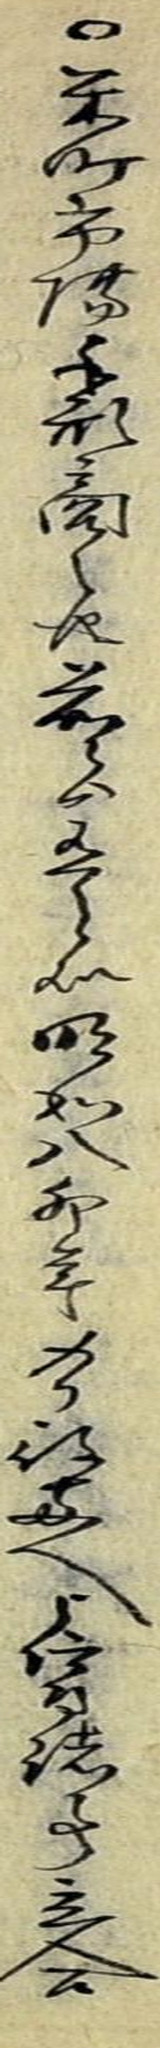○米町市場手形商之儀前々ゟ有之候処明和八卯年〆り役両人被仰付諸事立合
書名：命令之部 四
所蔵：福井県文書館 Fukui Prefectural Archives
